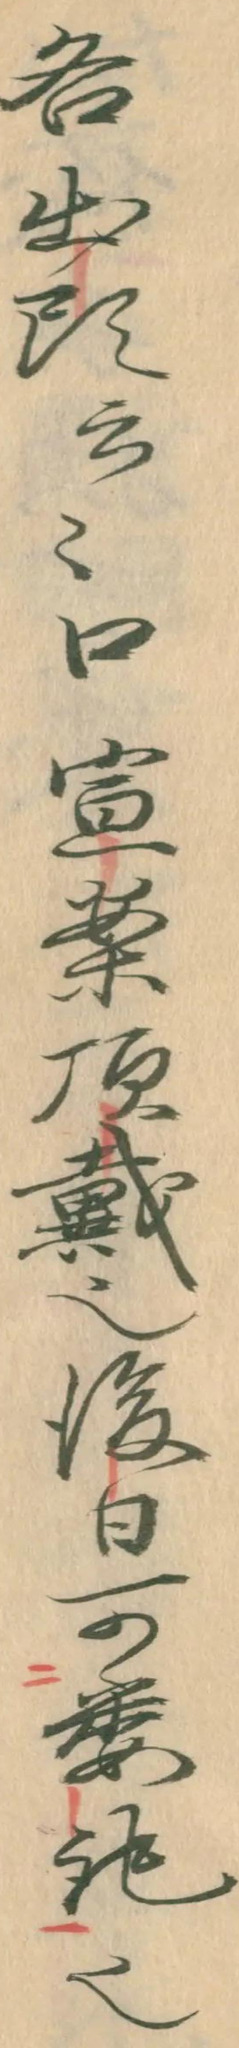各出-頭云々口宣-案頂-戴也後-日可委_記也
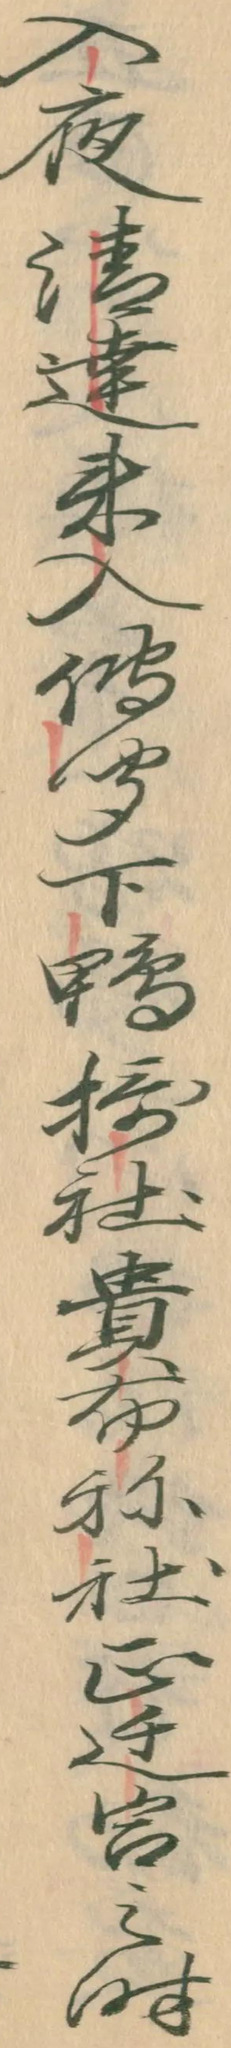入-夜清達来-入伝_聞下_鴨摂-社貴-布-祢_社正-迁-宮之時
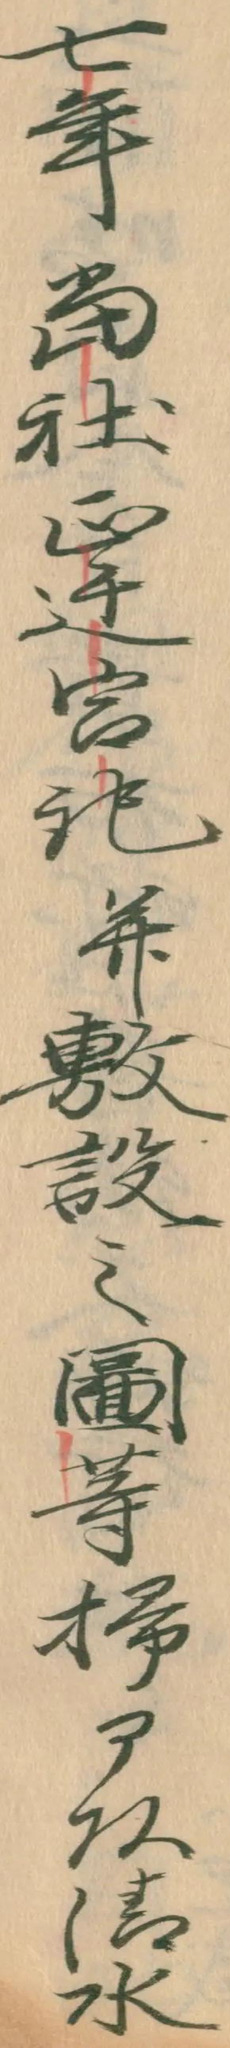七-年当-社正-迁-宮-記并敷設之図_等掃部頭清水
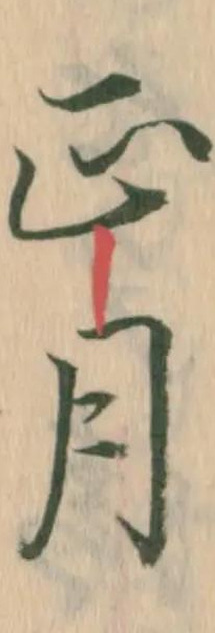正-月
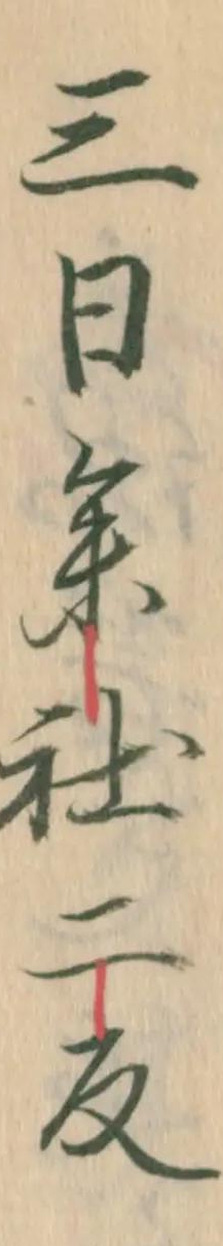三日参-社二-反
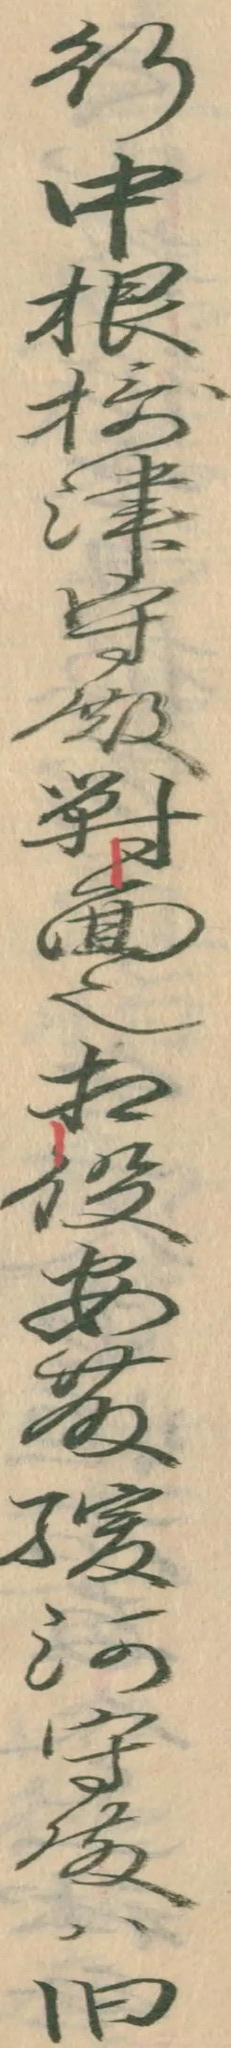行中根摂津守殿対-面也相_役安藤駿河守殿ハ旧

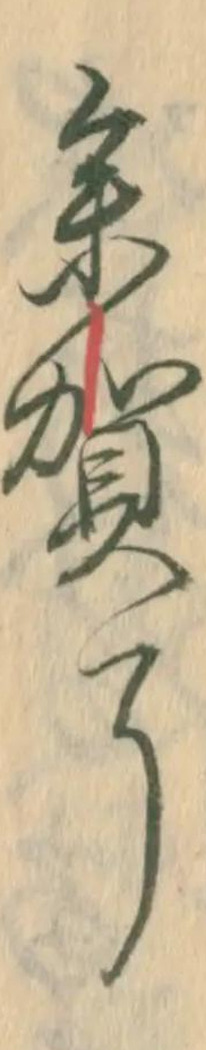参-賀了
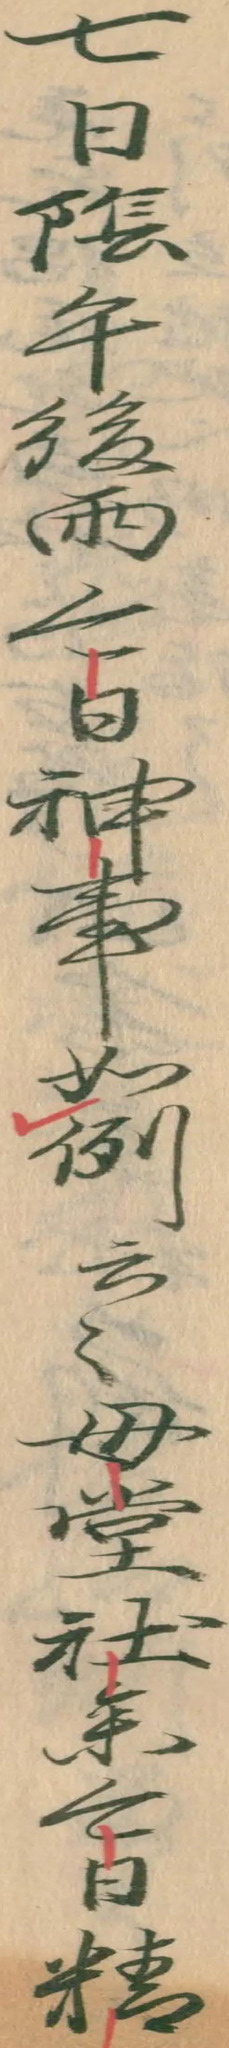七日陰午後雨今-日神-事如例云々母-堂社-参今-日精-
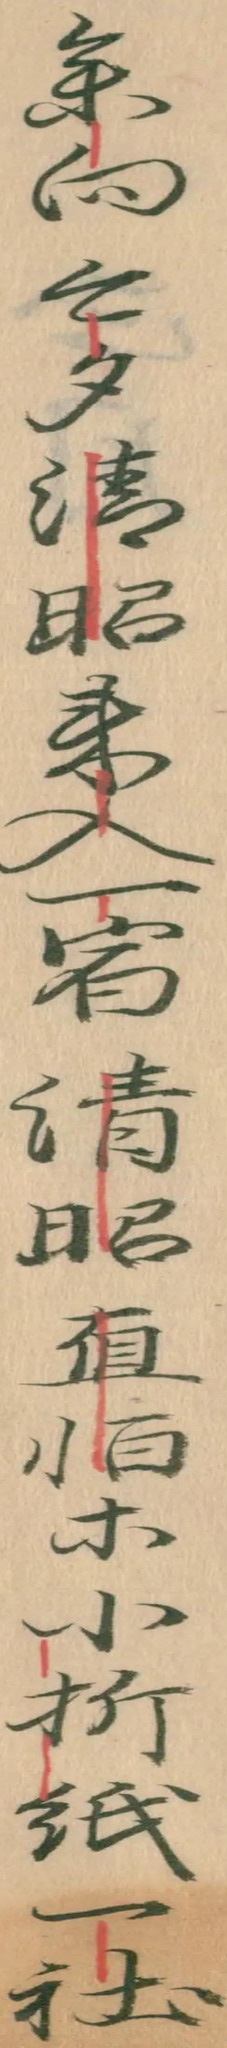参-向今-夕清昭来-入一-宿清昭直恒等小_折_紙一-社
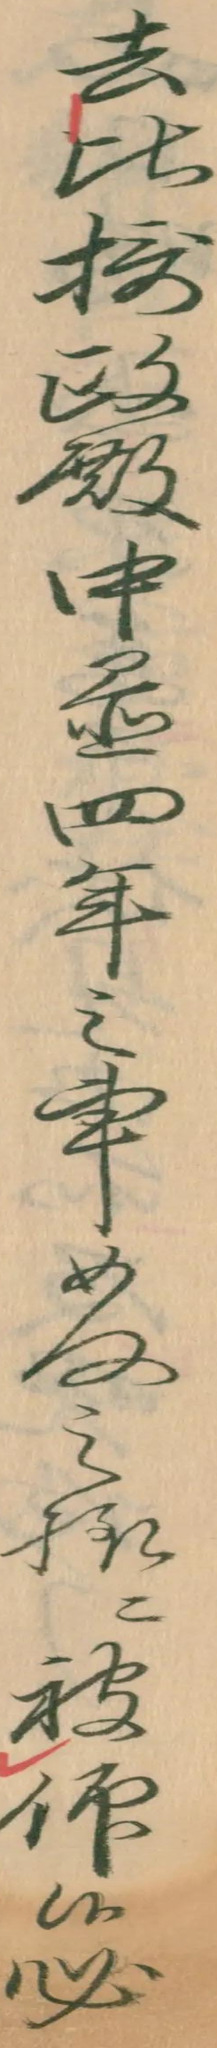去_比摂政殿中置四年之事如何之様ニ被仰候必
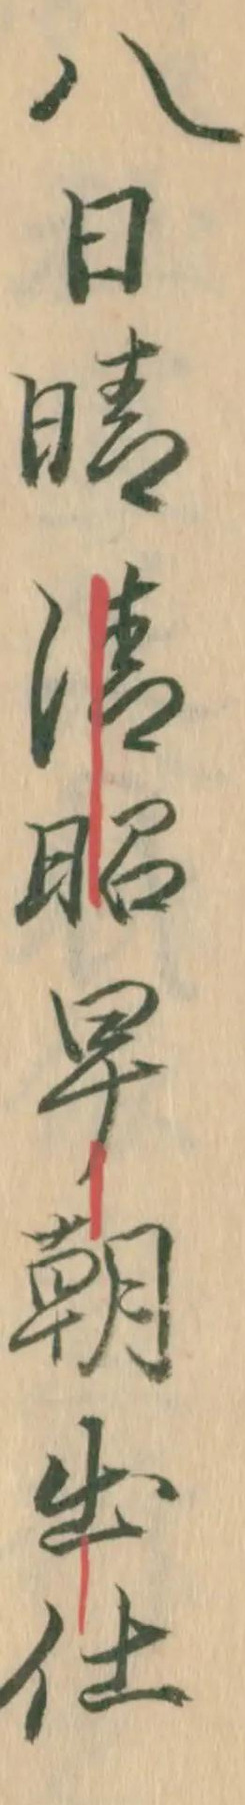八日晴清昭早-朝出-仕
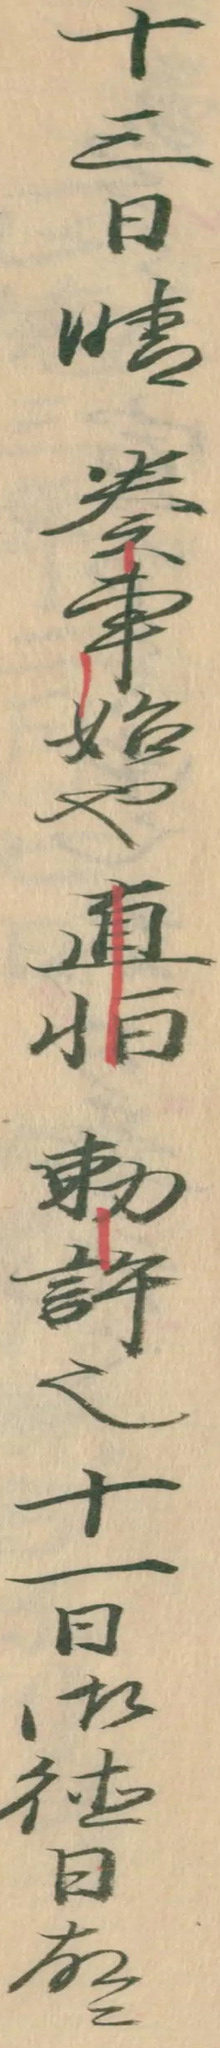十三日晴奏-事_始也直恒勅-許也十一日御徳日故ニ

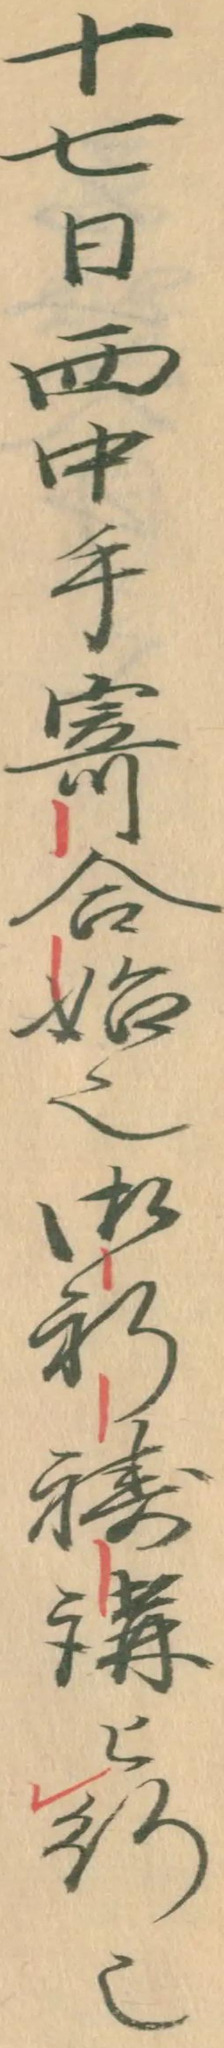十七日西中手寄_合_始也御-祈-祷-講被行也
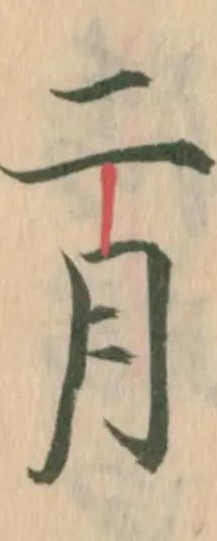二-月
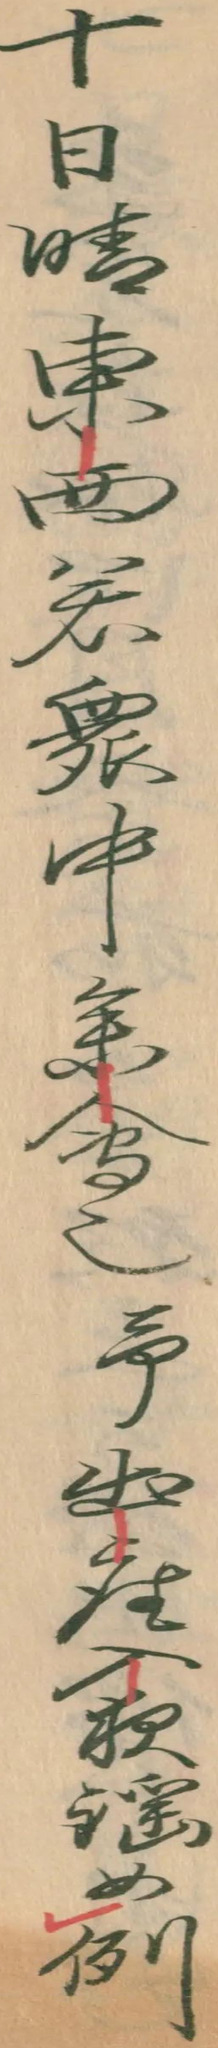十日晴東-西着衆中参-会也予出-座入-夜謡如例
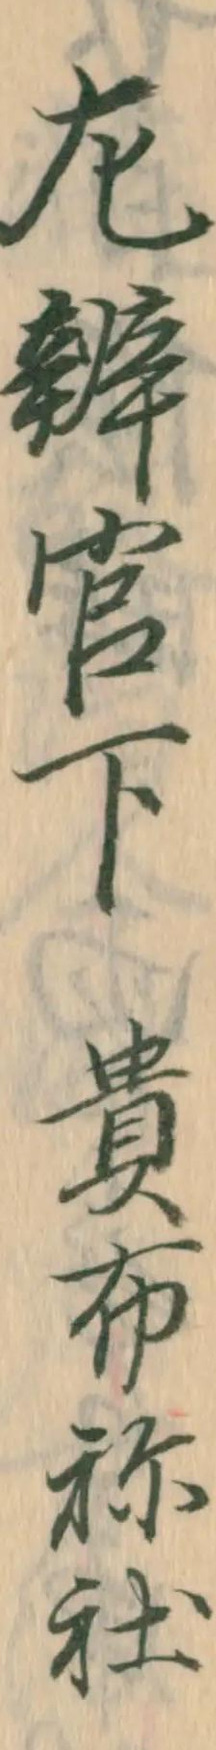左弁官下貴布祢社
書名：賀茂社記録. 第16冊
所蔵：国立国会図書館 National Diet Library, JAPAN
